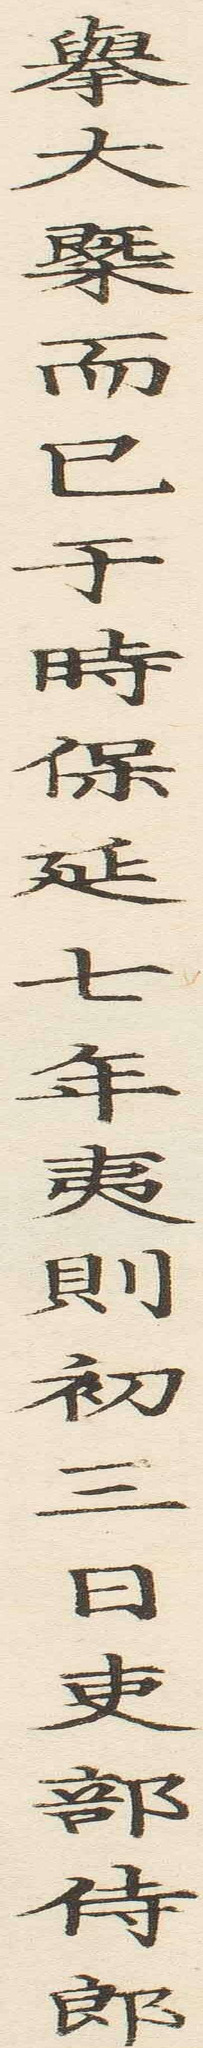擧大槩而巳于時保延七年夷則初三日吏部侍郎
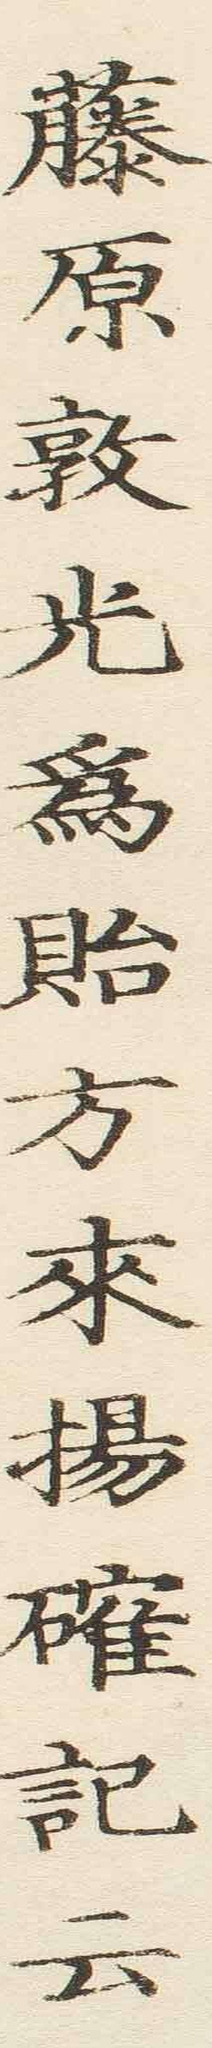藤原敦光爲貽方來揚確記云
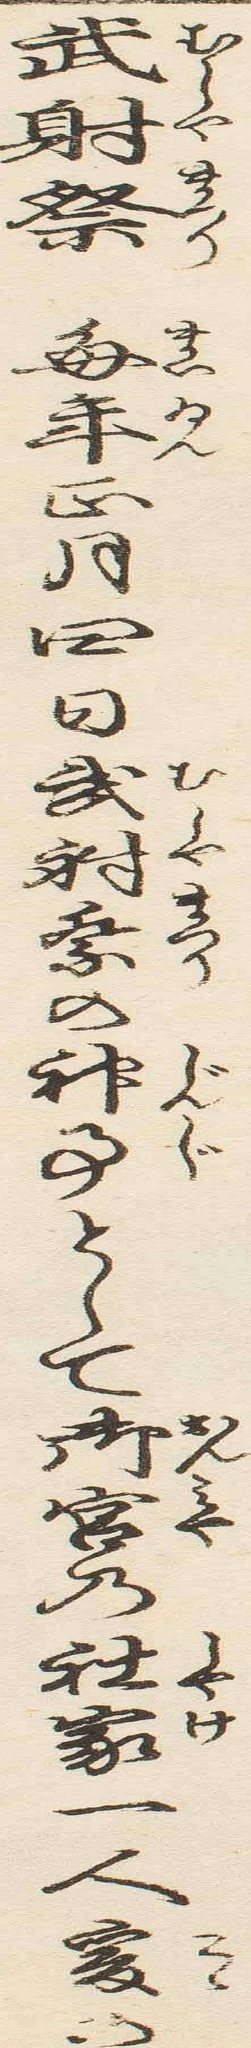武射祭毎年正月四日武射祭の神事として御宮の社家一人爰の
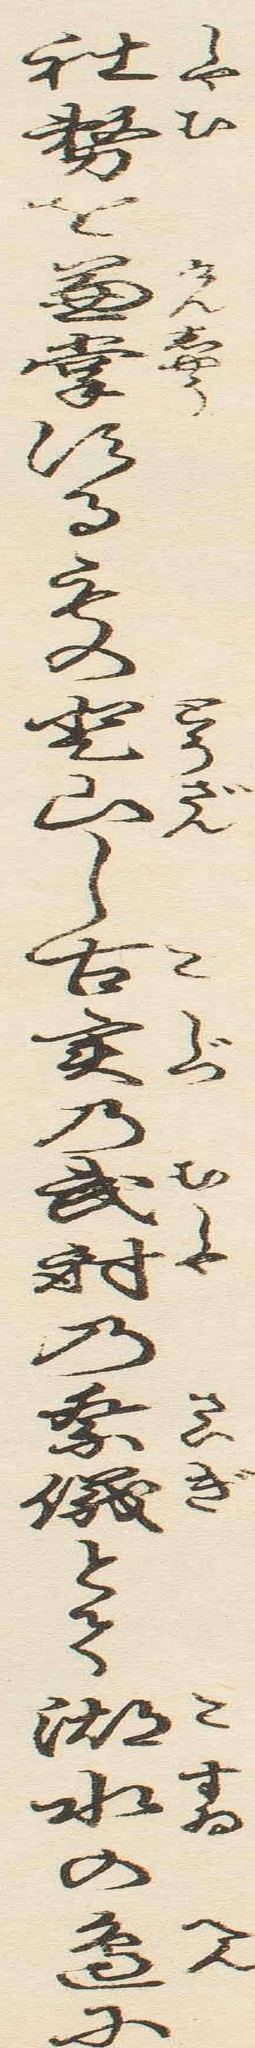社務を兼掌するもの登山し古実の武射の祭儀とて湖水の邊に
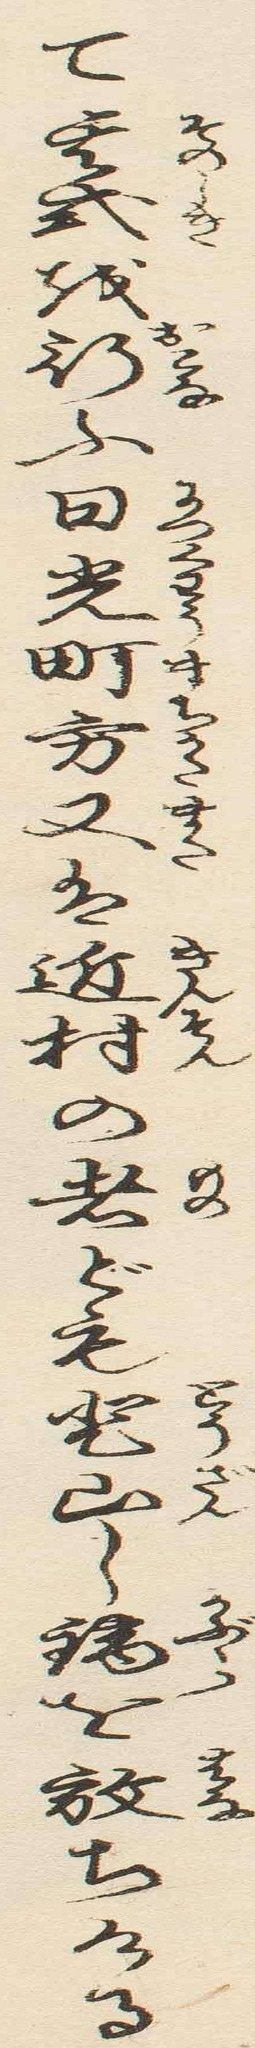て其式を行ふ日光町方又は近村の者ども登山し鏑を放ちける
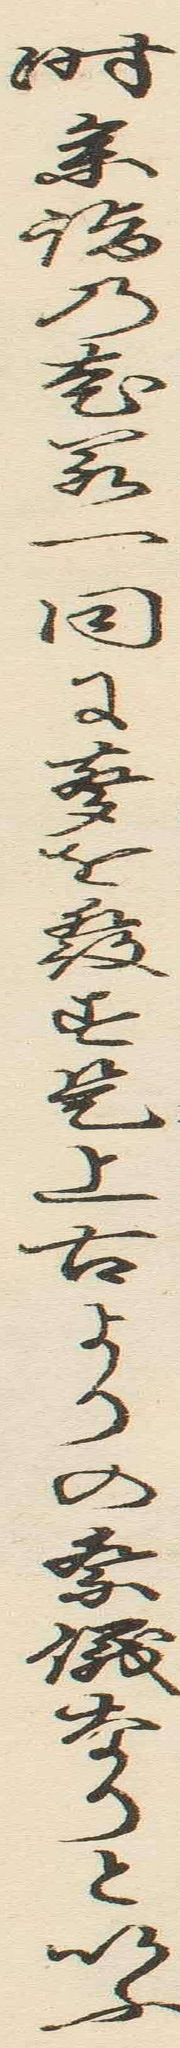时参詣の老若一同に聲を發す是上古よりの祭儀なりといふ
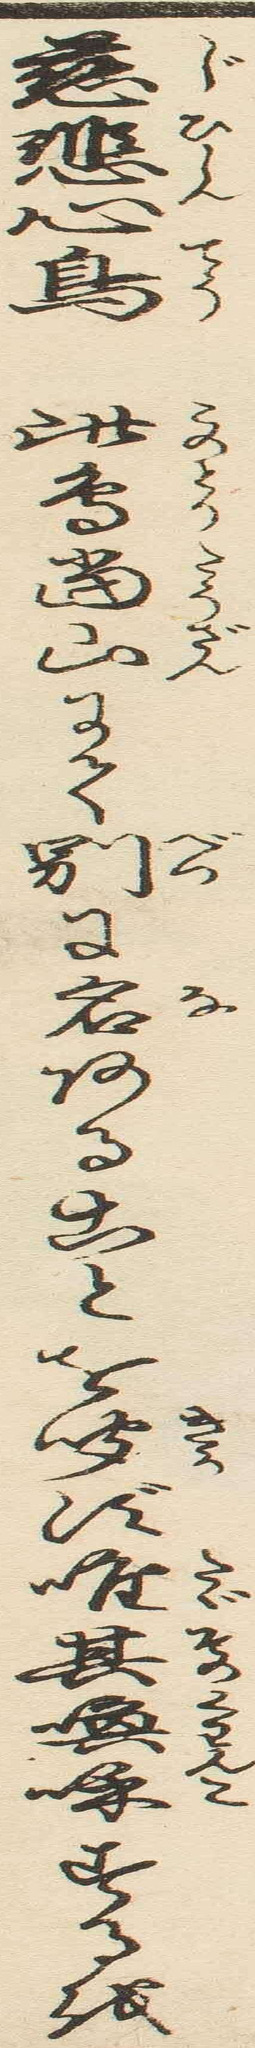慈悲心鳥此鳥當山にて別に名あることを聞ず唯其喚呼するを

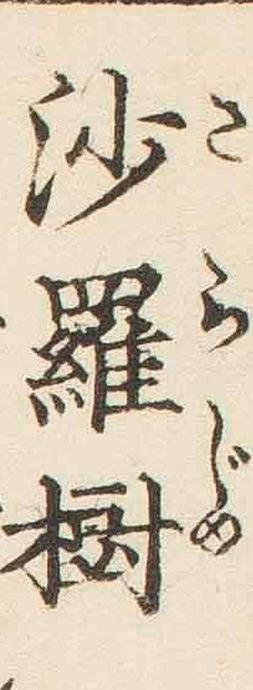沙羅樹
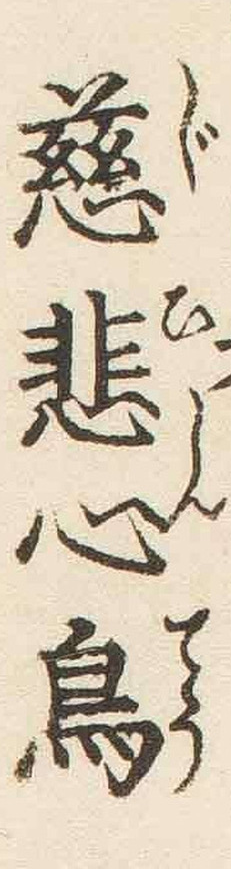慈悲心鳥
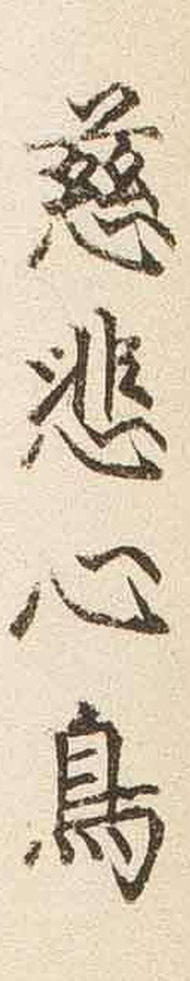慈悲心鳥
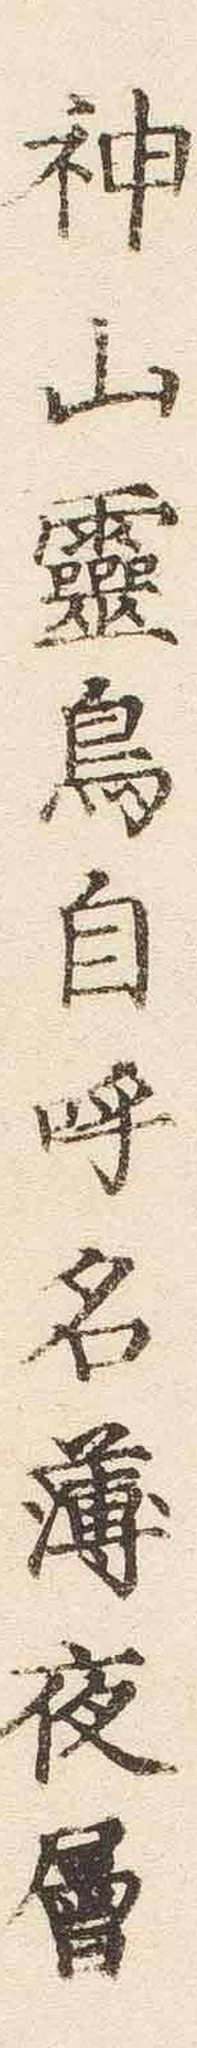神山靈鳥自呼名薄夜層
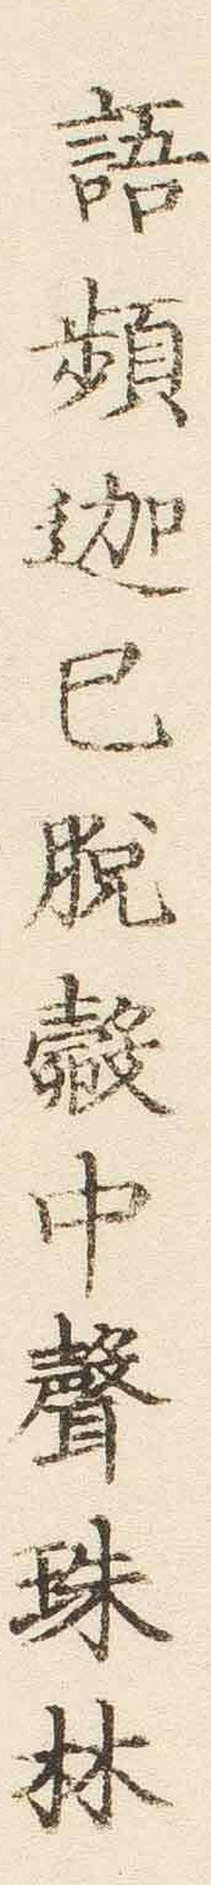語頻迦巳脫㲉中聲珠林
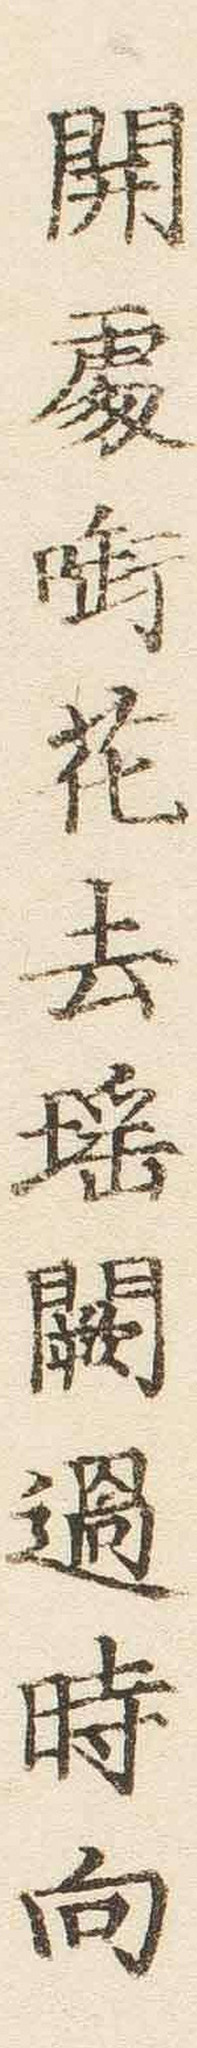開䖏花去瑶闕過時向
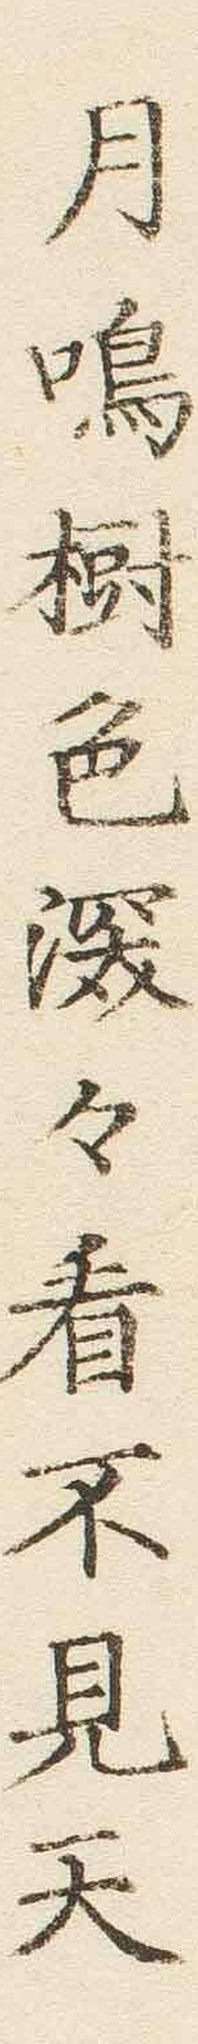月鳴樹色㴱々看不見天
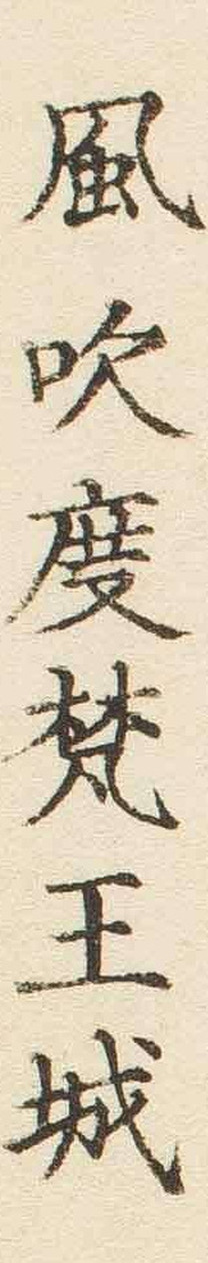風吹度梵王城
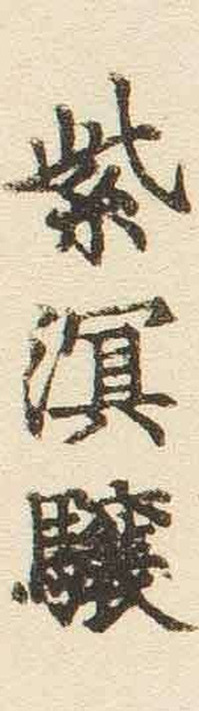紫溟驤
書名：日光山志
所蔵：東京学芸大学附属図書館 国文学研究資料館
